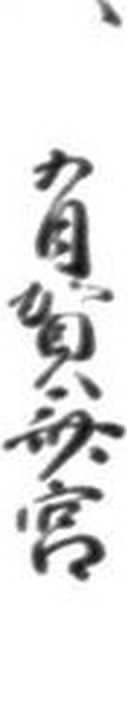有賀斎宮
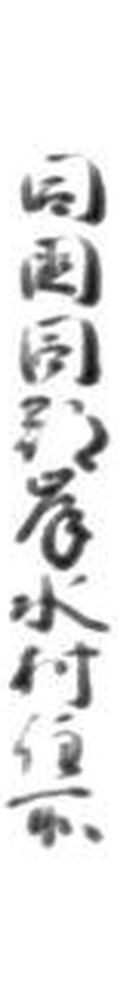同国同郡岸水村住所
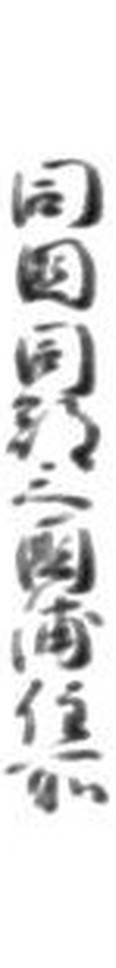同国同郡三国浦住所
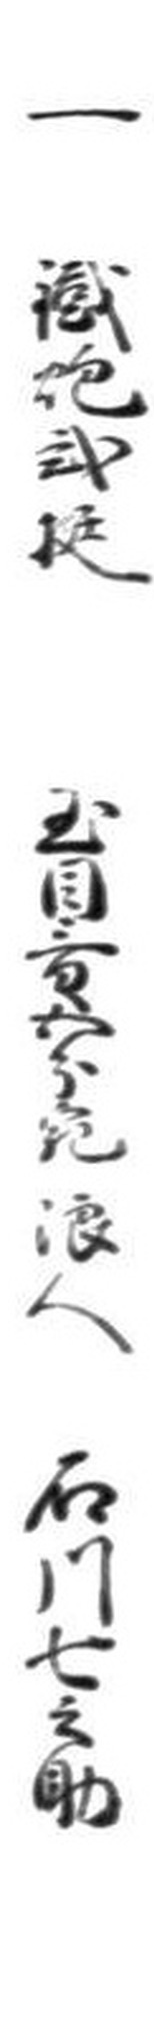一鉄炮弐挺玉目三匁五分宛浪人石川七之助
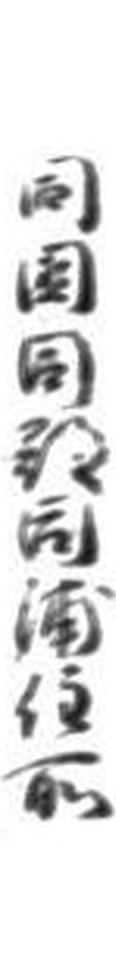同国同郡同浦住所
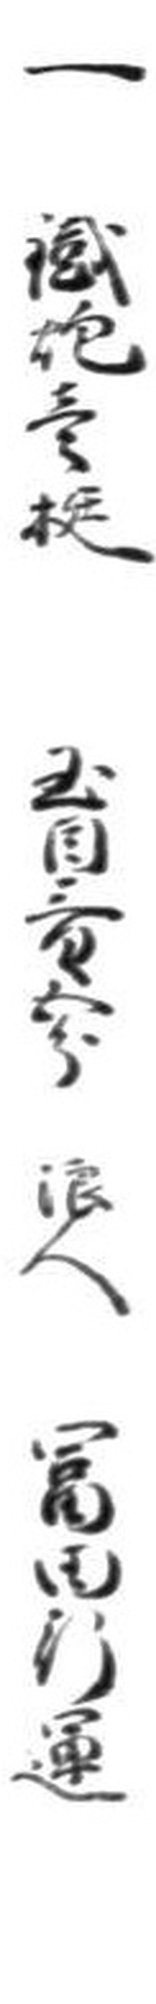一鉄炮壱挺玉目三匁五分浪人冨田行運

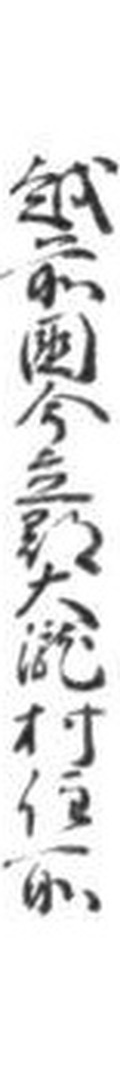越前国今立郡大滝村住所
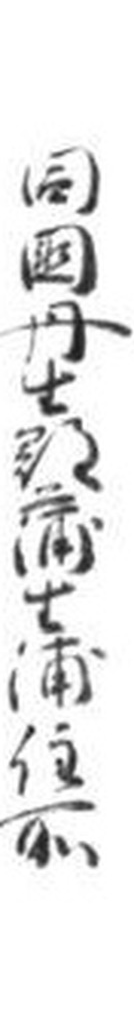同国丹生郡蒲生浦住所
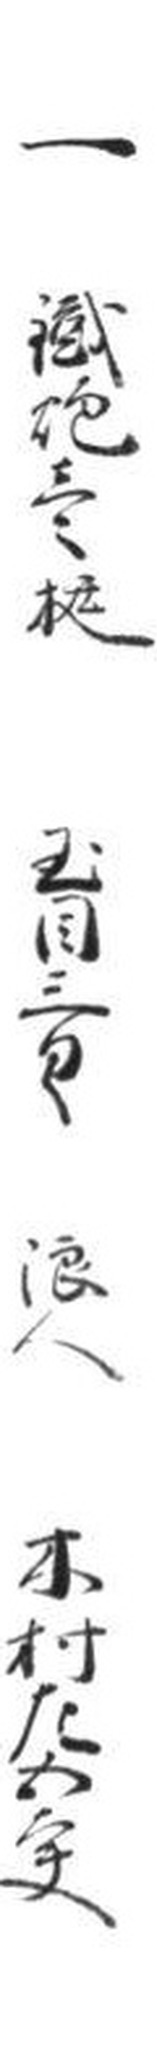一鉄炮壱挺玉目三匁浪人木村左五大夫
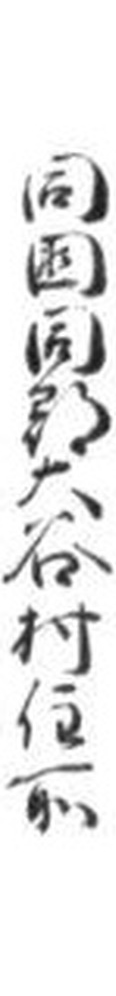同国同郡大谷村住所
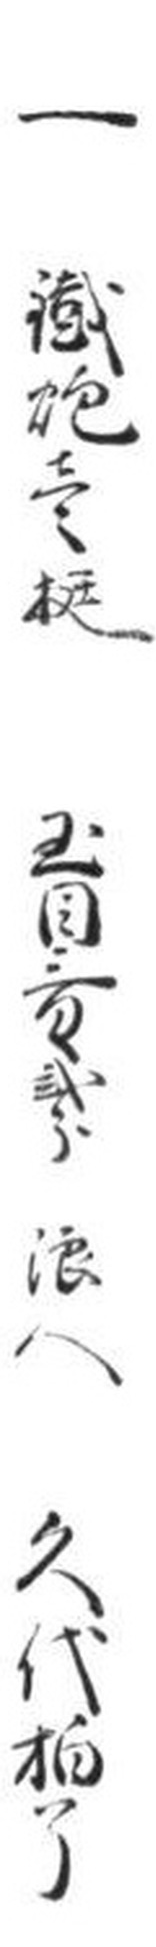一鉄炮壱挺玉目三匁弐分浪人久代柏了
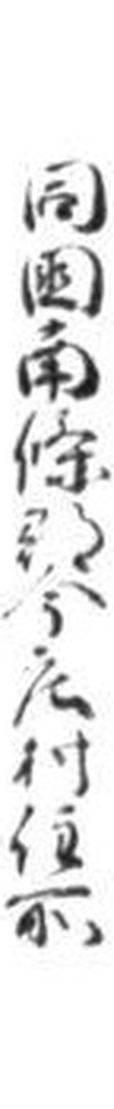同国南條郡今庄村住所
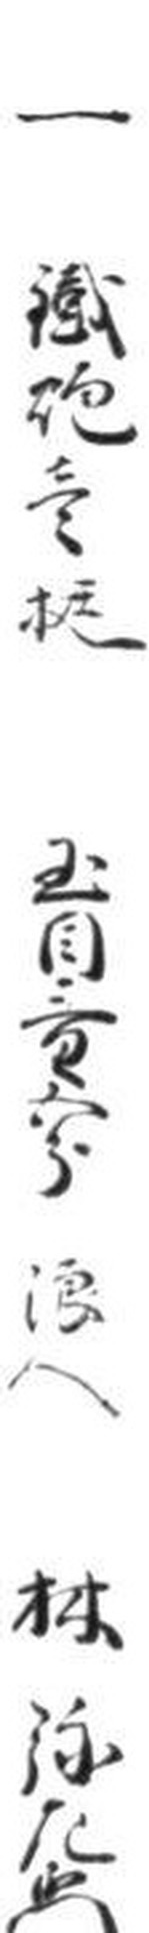一鉄炮壱挺玉目三匁五分浪人林弥左衛門
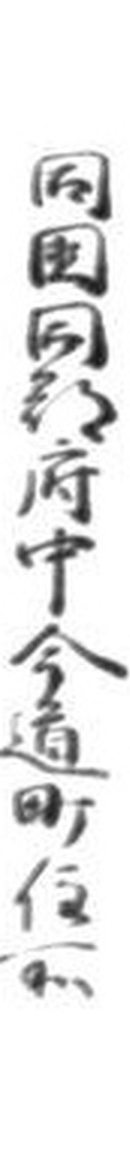同国同郡府中今道町住所
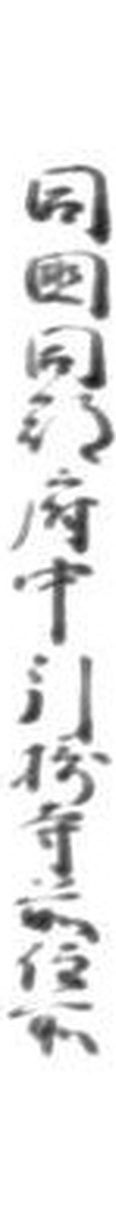同国同郡府中引接寺前住所
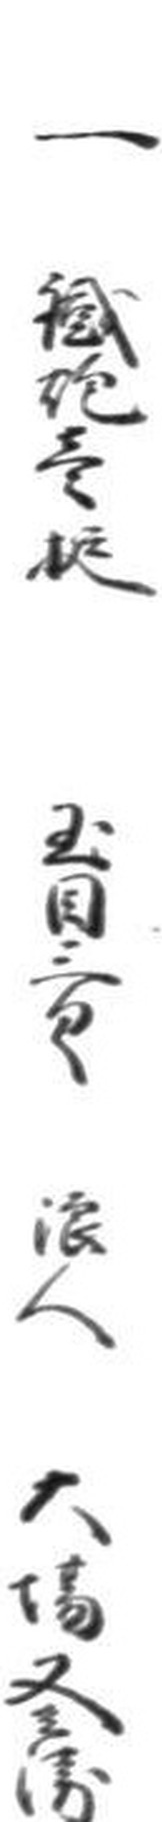一鉄炮壱挺玉目三匁浪人大場又兵衛
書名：家譜 十七 吉品公 従元禄元年到同二年
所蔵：福井県文書館 Fukui Prefectural Archives
